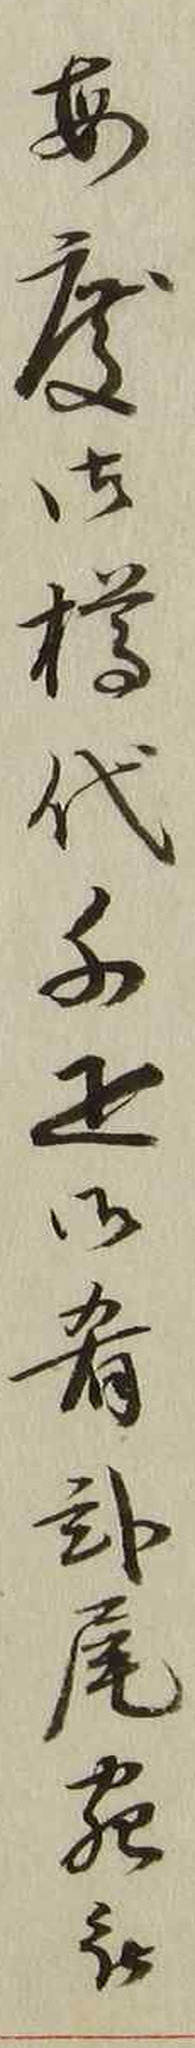毎度御樽代千疋御肴弐尾宛被
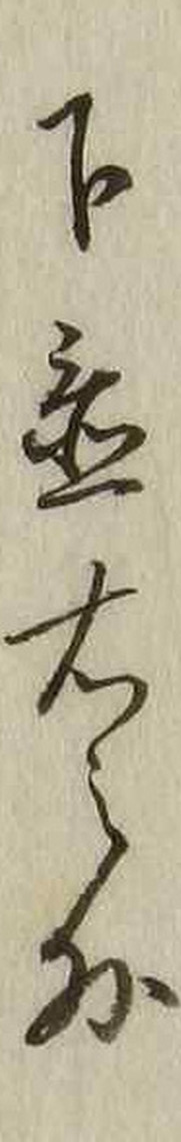下置右之外
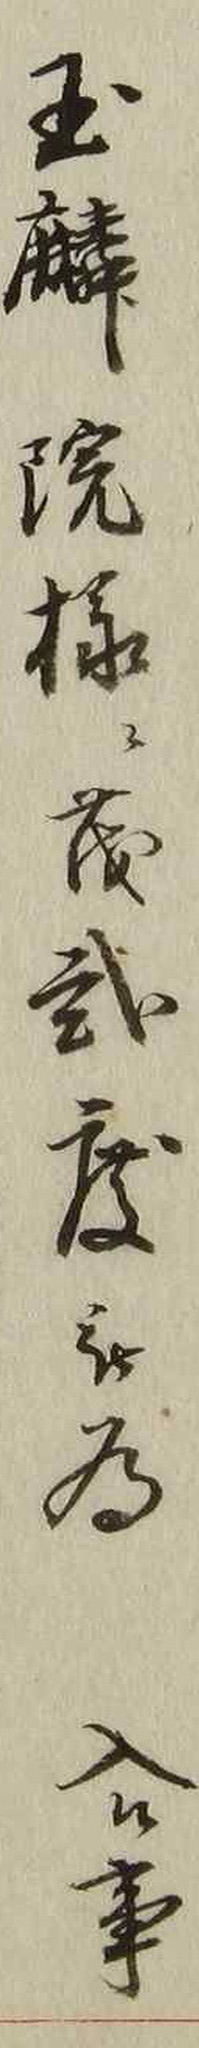玉麟院様にも弐度被為入候事
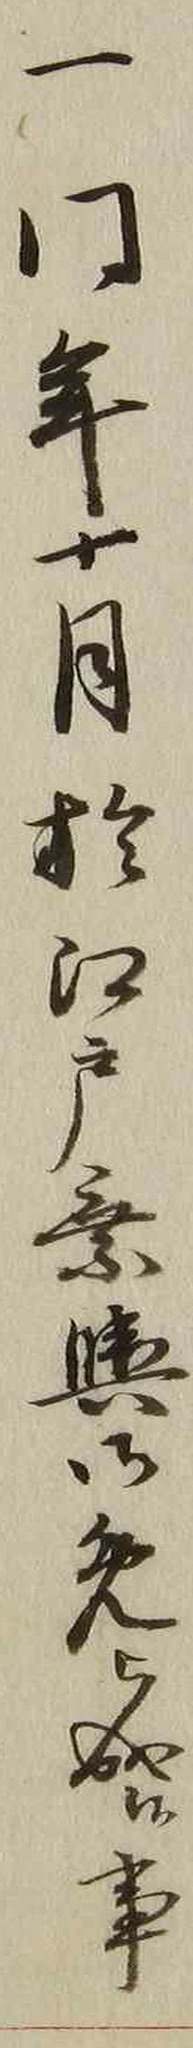一同年十月於江戸乗輿御免被成候事
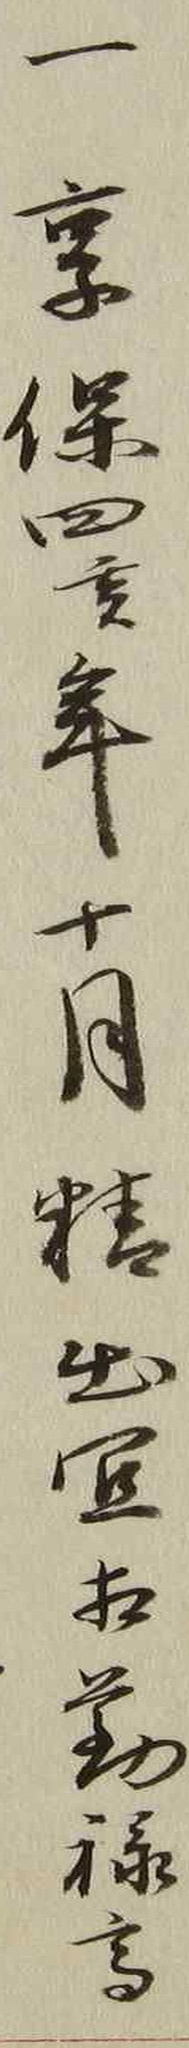一享保四亥年十月精出宜相勤禄高
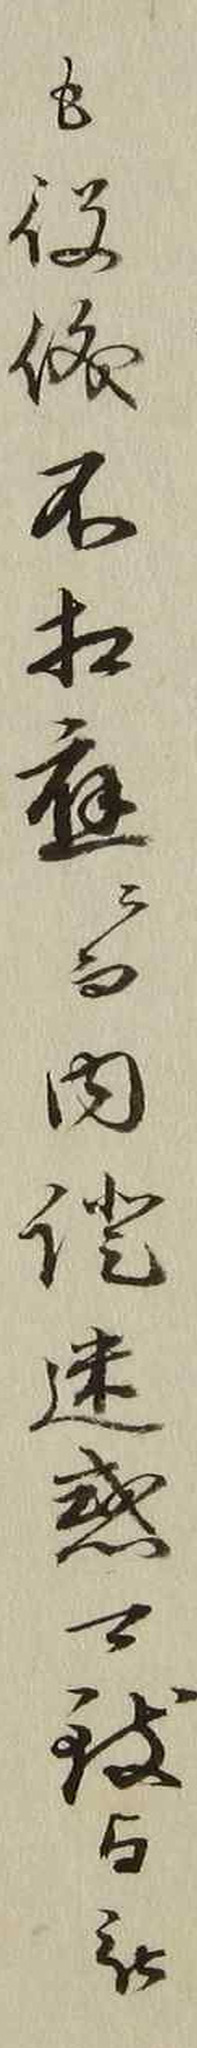も役儀不相応に而内証迷惑可致と被
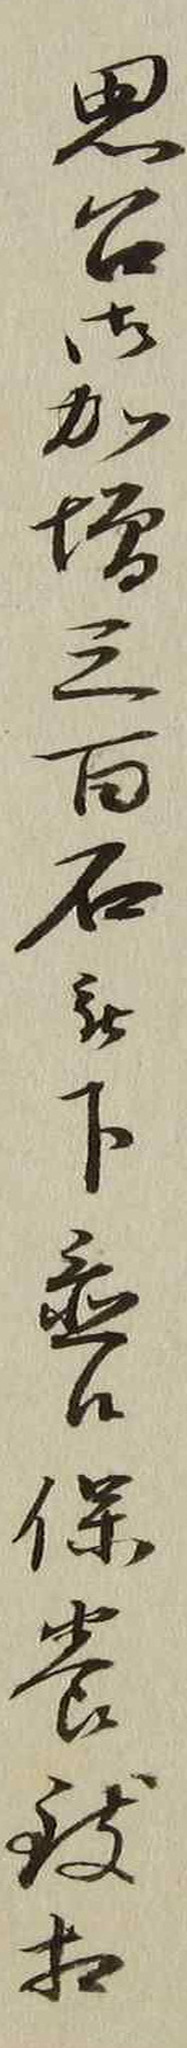思召御加増三百石被下置候保養致相
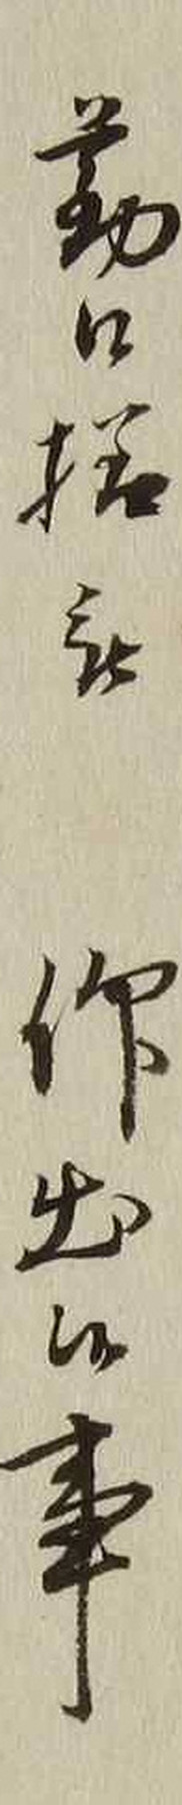勤候様被仰出候事
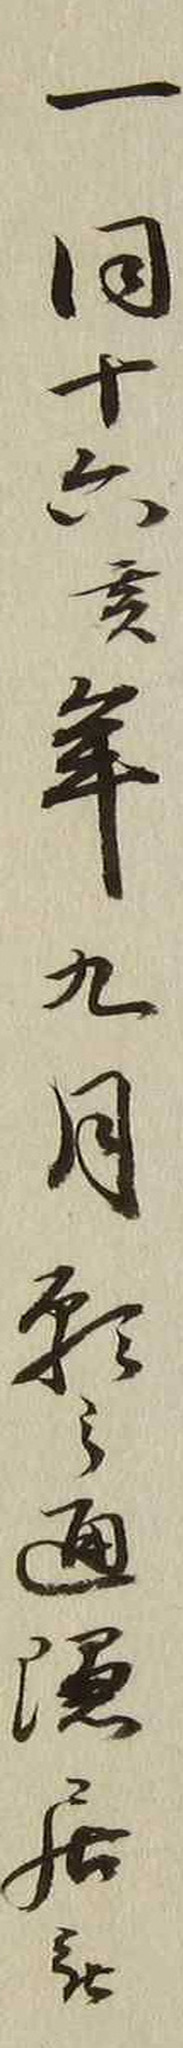一同十六亥年九月願之通隠居被
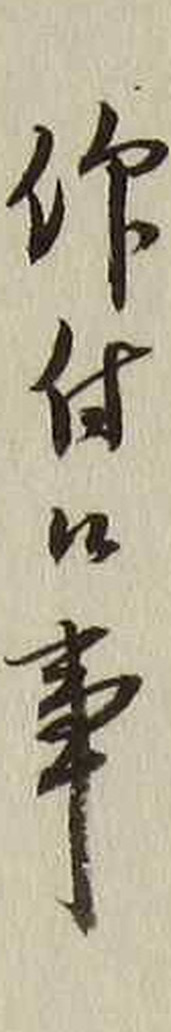仰付候事
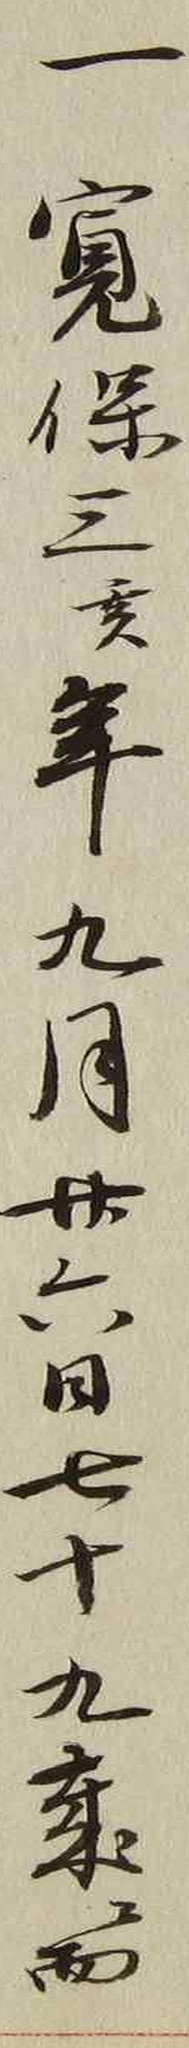一寛保三亥年九月廿六日七十九歳に而
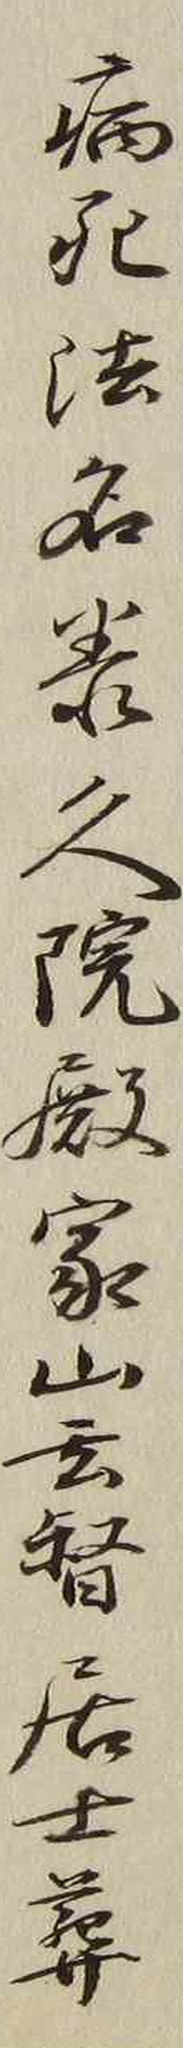病死法名泰久院殿家山玄督居士葬
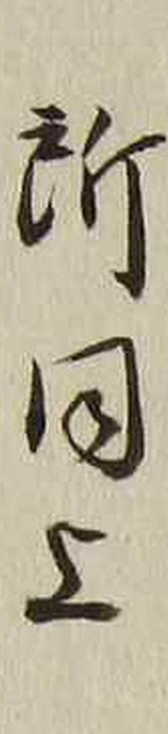所同上
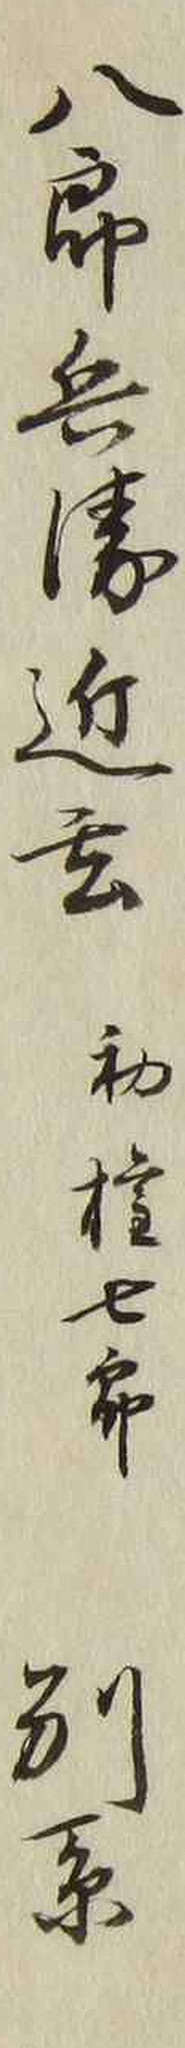八郎兵衛近玄初権七郎別系

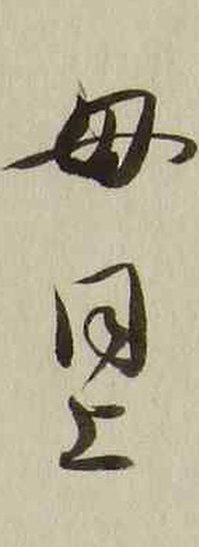母同上
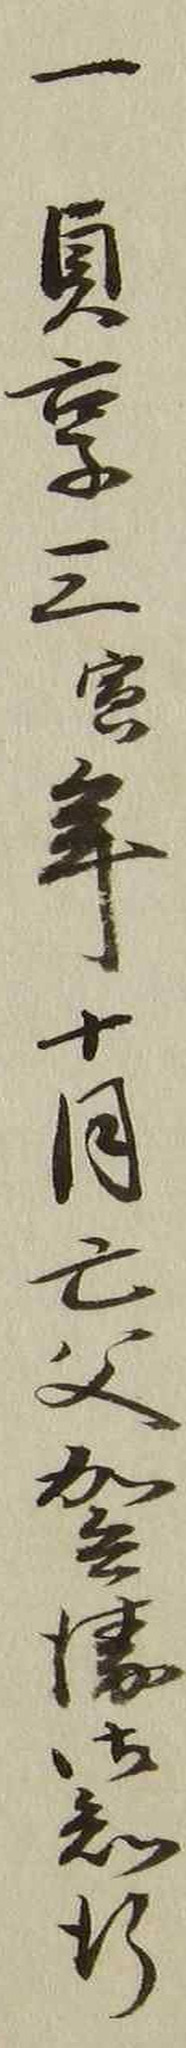一貞享三寅年十月亡父加兵衛御知行
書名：諸士系譜　巻之125　た之部1
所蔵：会津若松市立会津図書館
